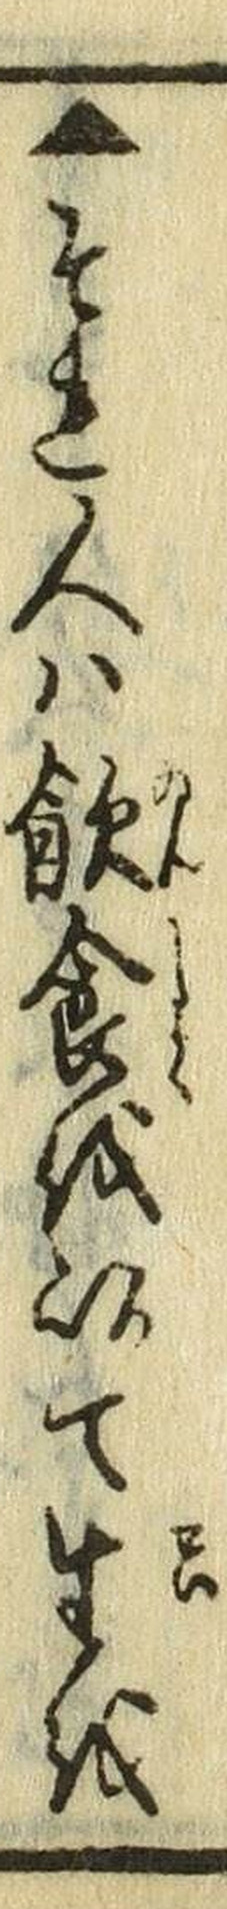▲それ人は飲食を以て生を
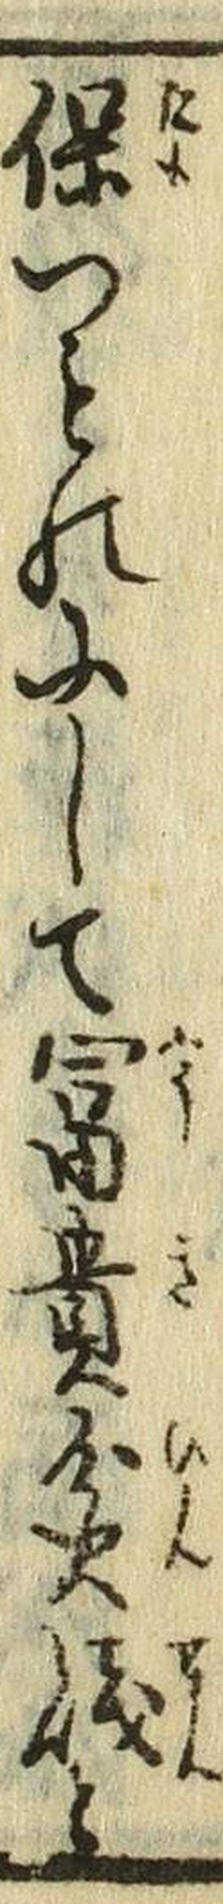保つものにして富貴貧賤と
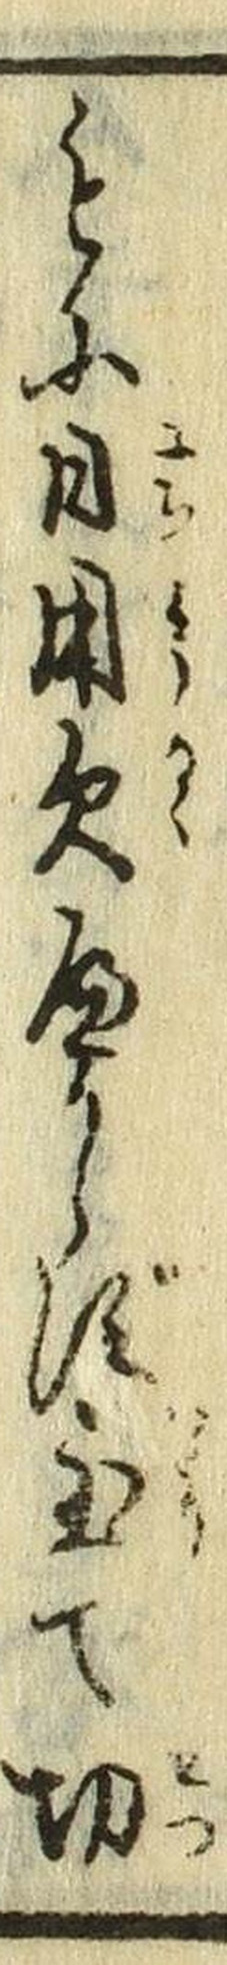もに日用欠へからず至て切
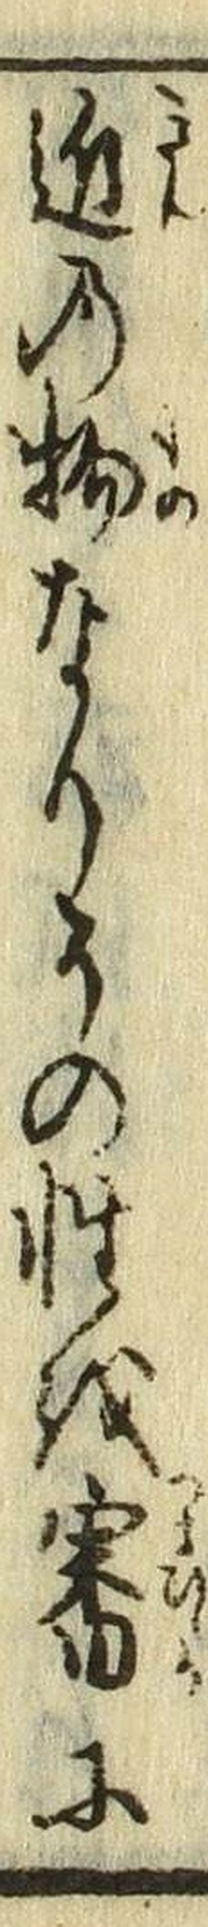近の物なりその性を詳審に
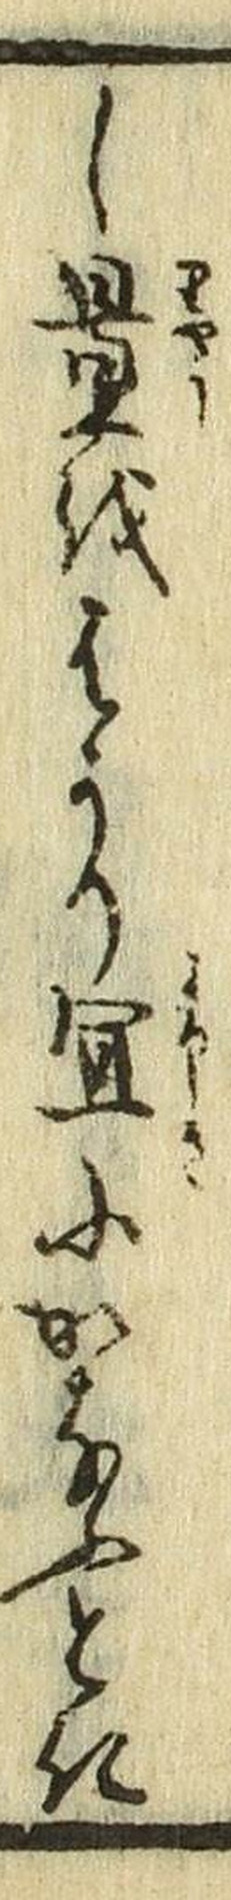し量をはかり宜にかなふとき
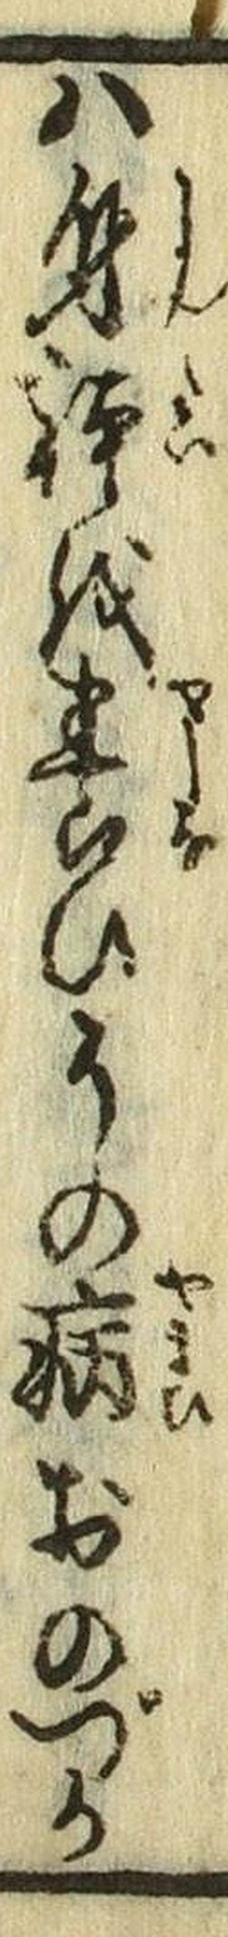は身体を養ひその病おのづか
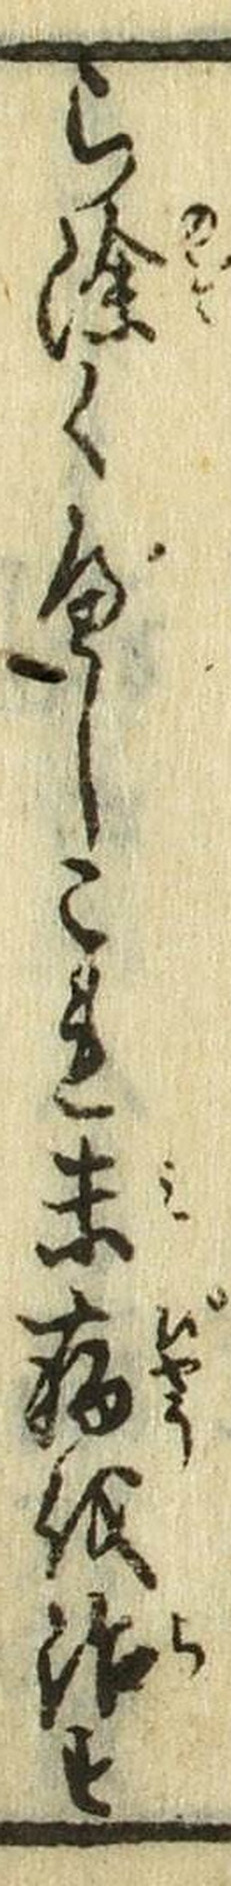ら除くべしこれ未病を治す
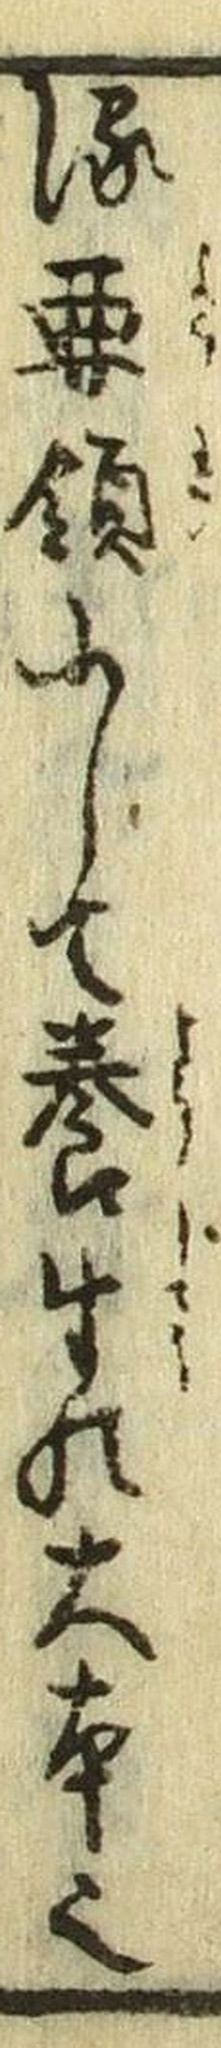る要領にして養生の大本也
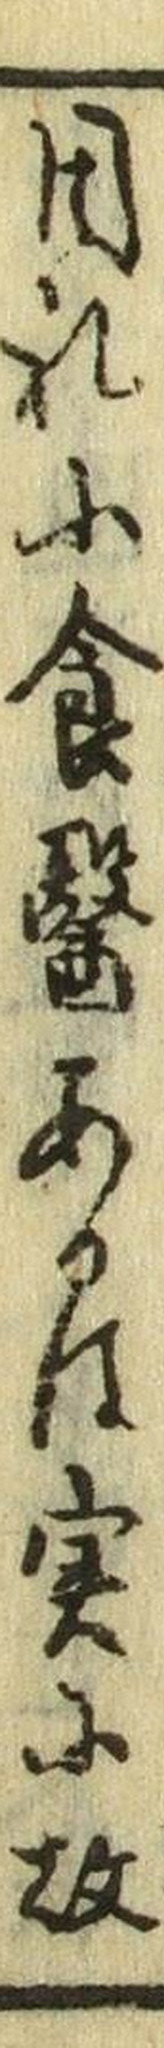周礼に食医あるは実に故

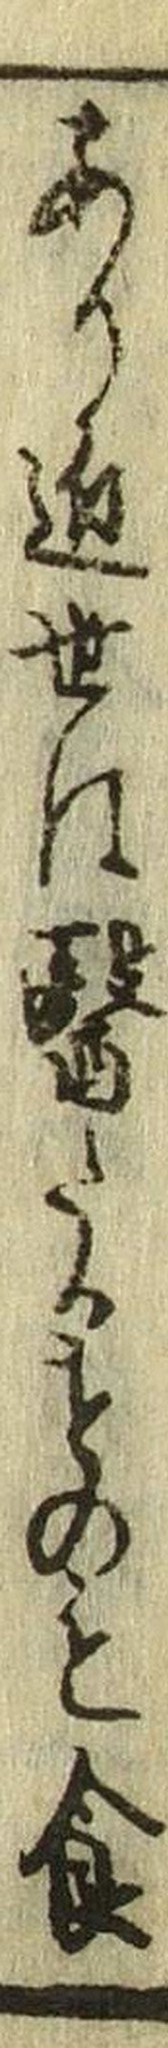あり近世は医たるものも食
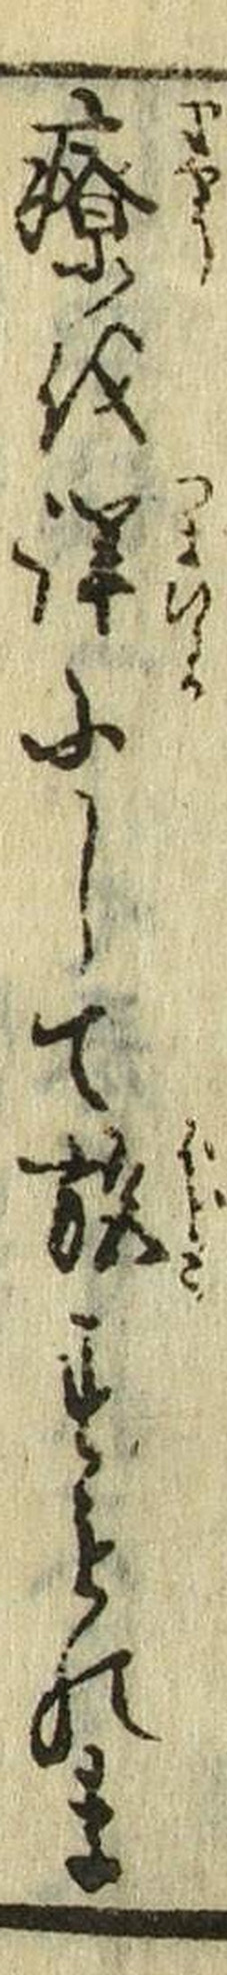療を詳にして施すものま
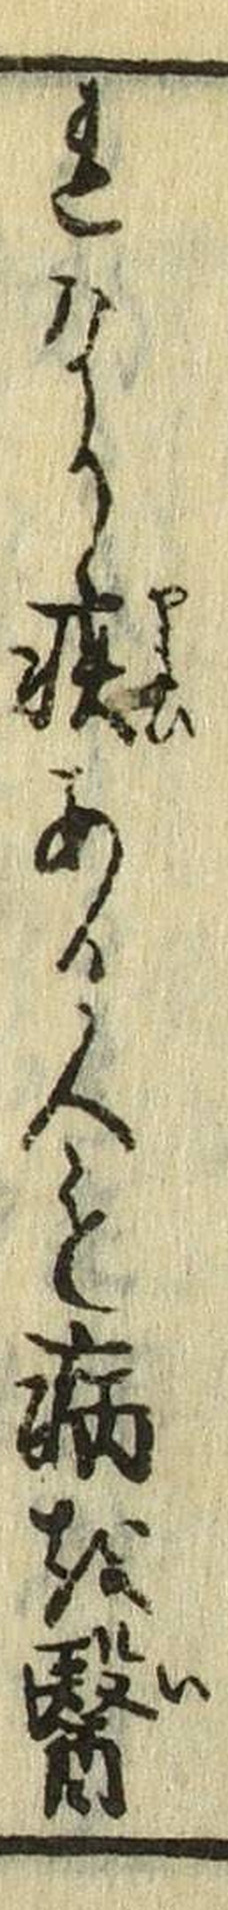れなり疾ある人も病を医
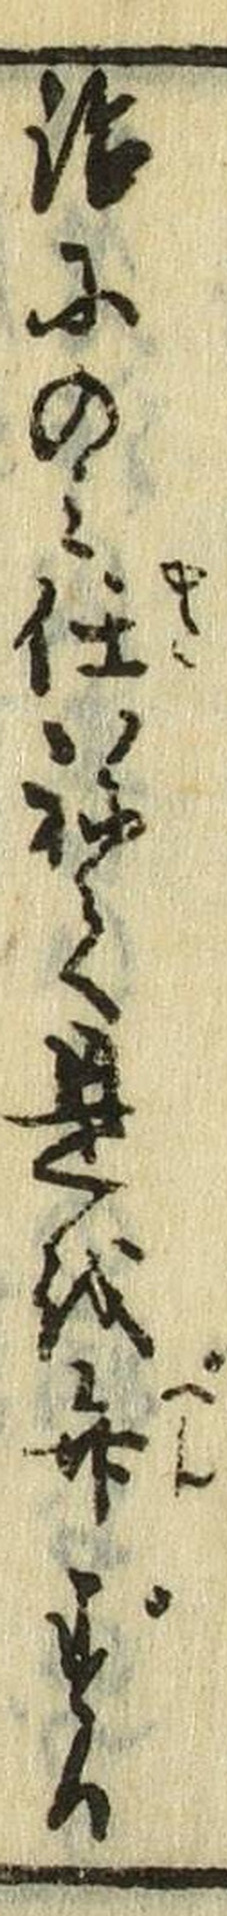治にのみ任ねて是を弁ずる
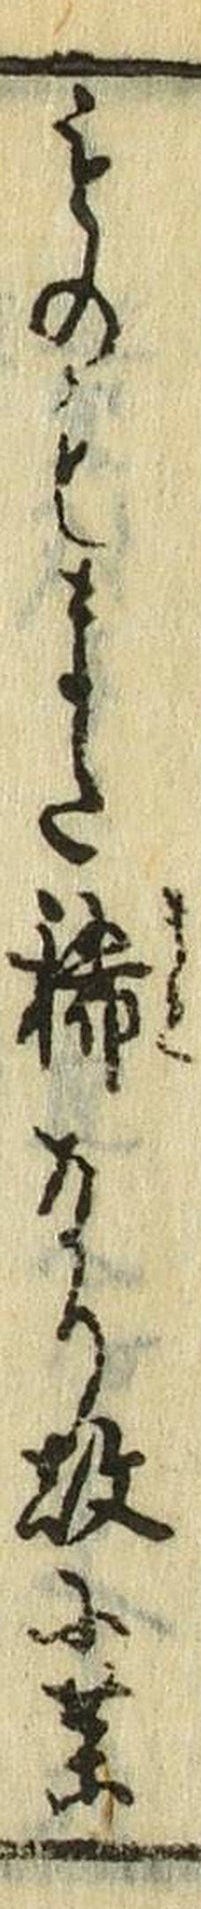ものもまた稀なり故に薬
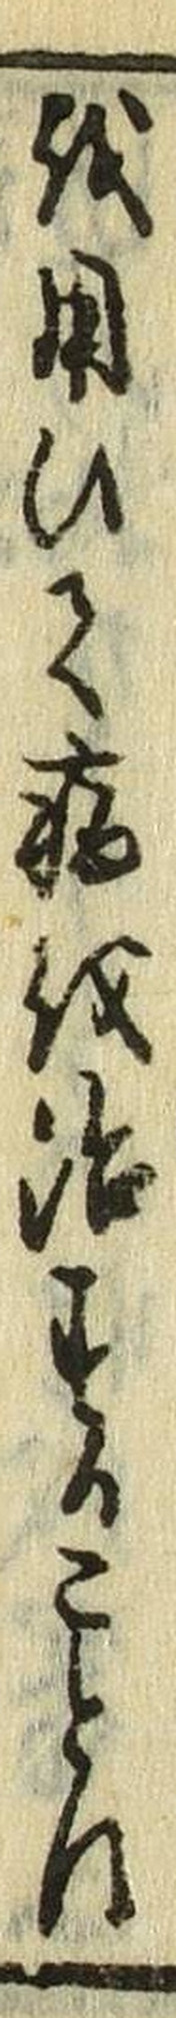を用ひて病を治することは
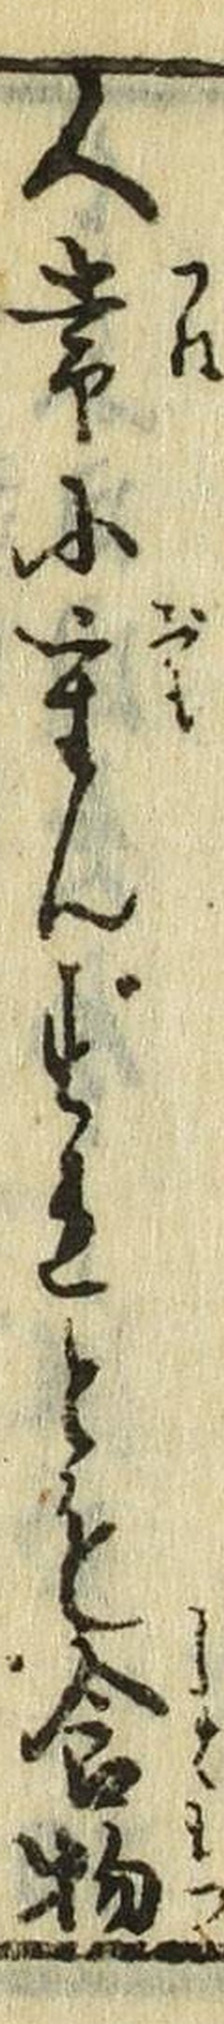人常に重んずれとも食物
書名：居家養生記
